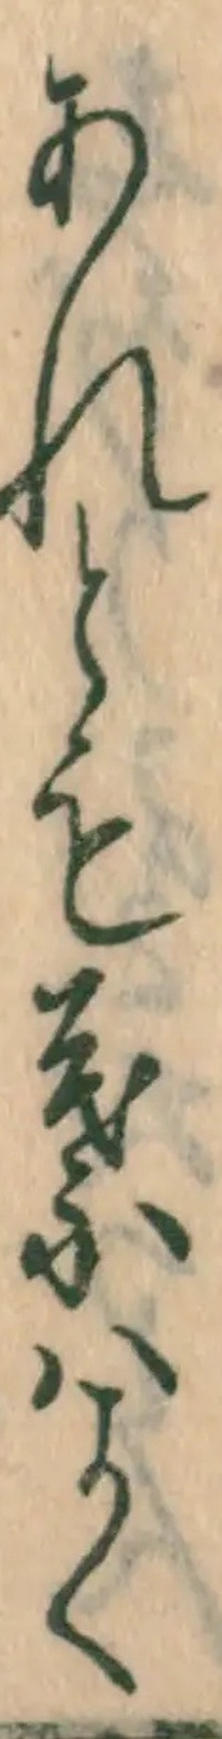あれとも葉はよく
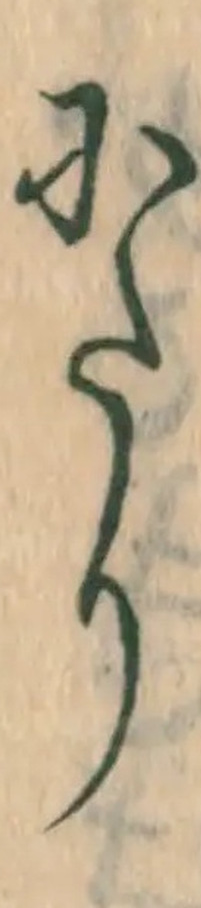にたり
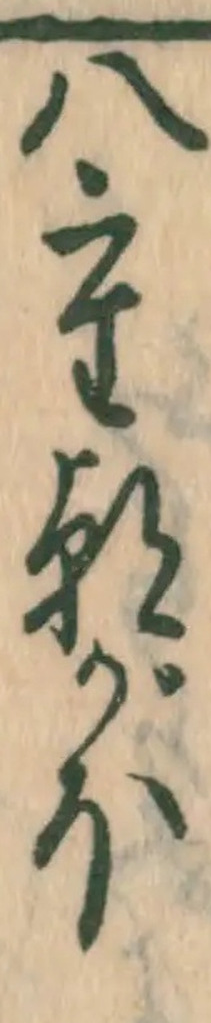八重朝がほ
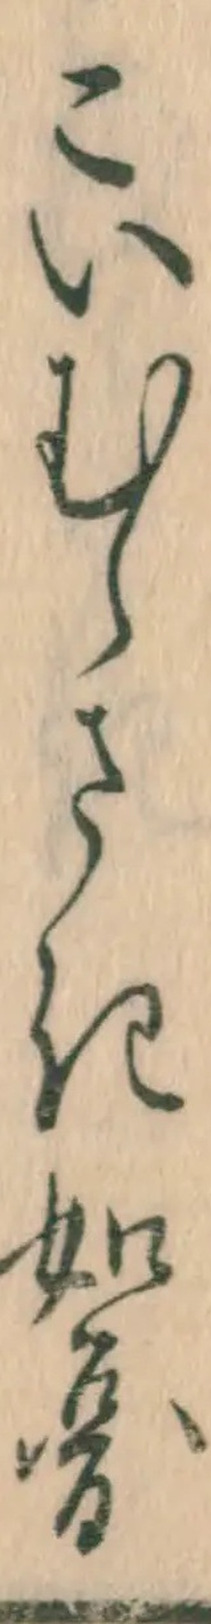こいむらさき如図
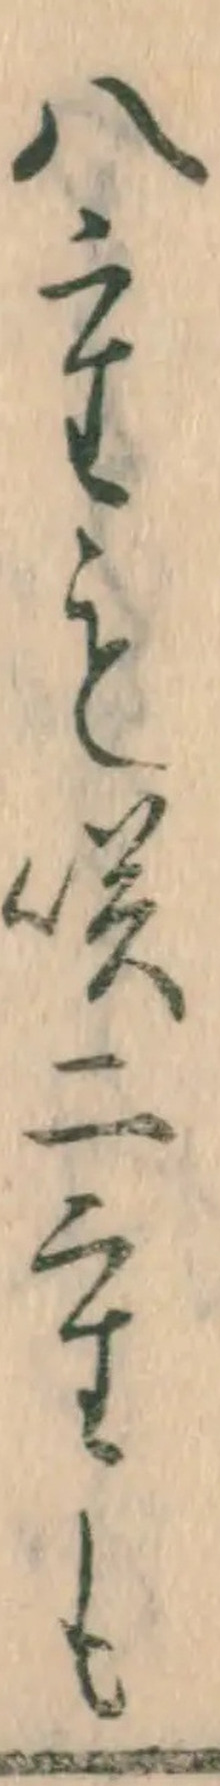八重も咲二重も
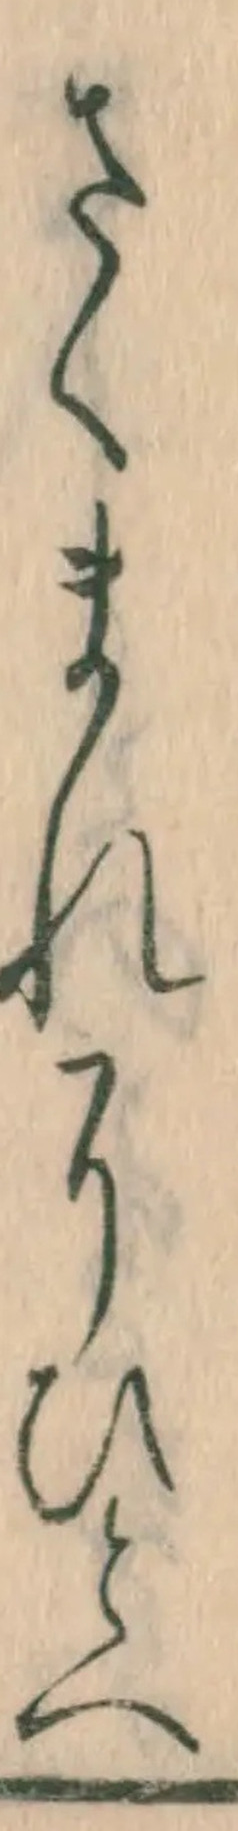さくまれにひとへ
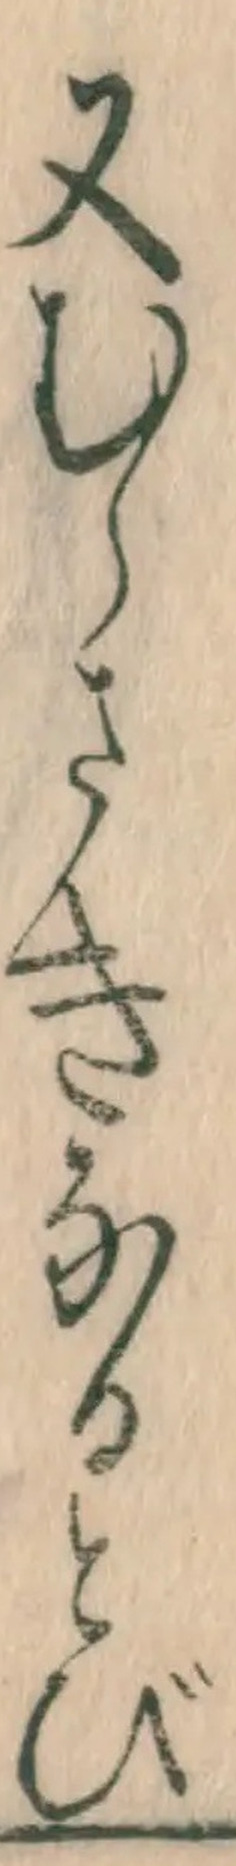又むらさきなるとび
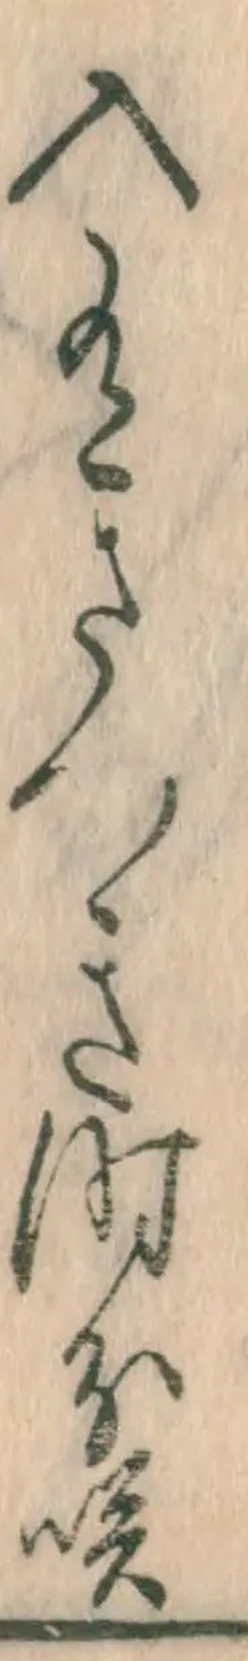入有さつき時分咲
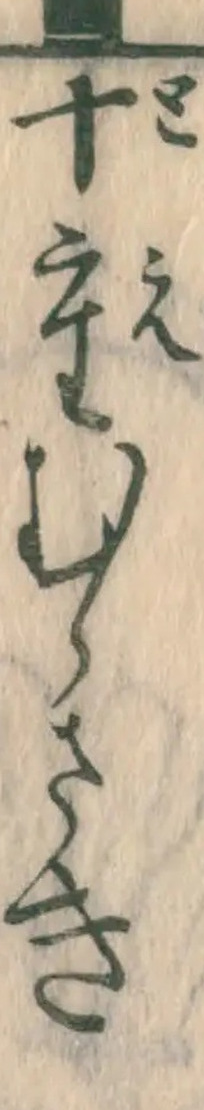十重むらさき
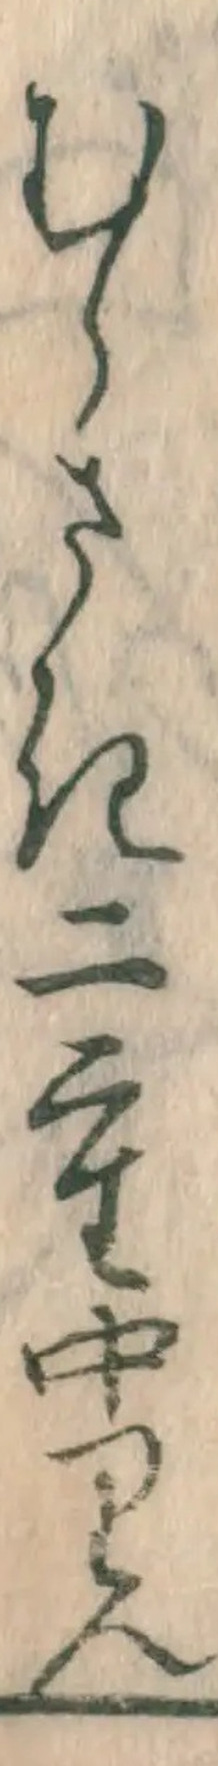むらさき二重中りん
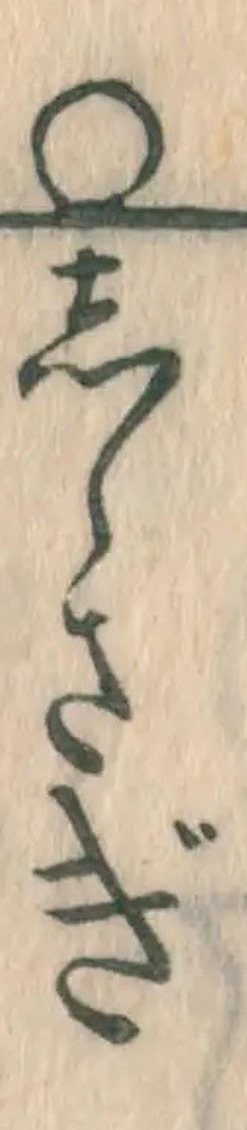○しらさぎ
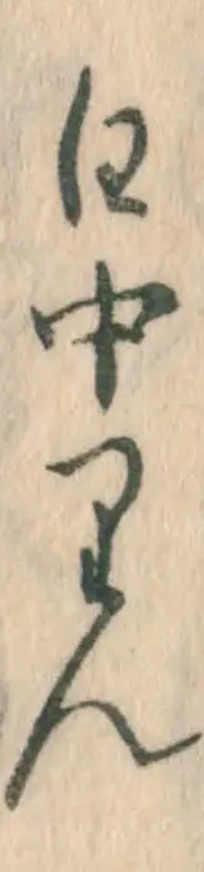白中りん

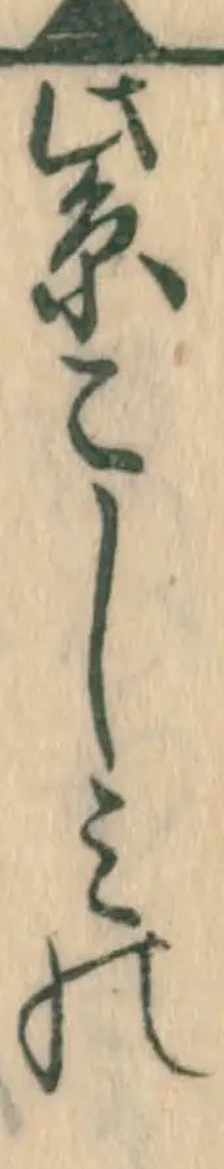▲紫こしみの
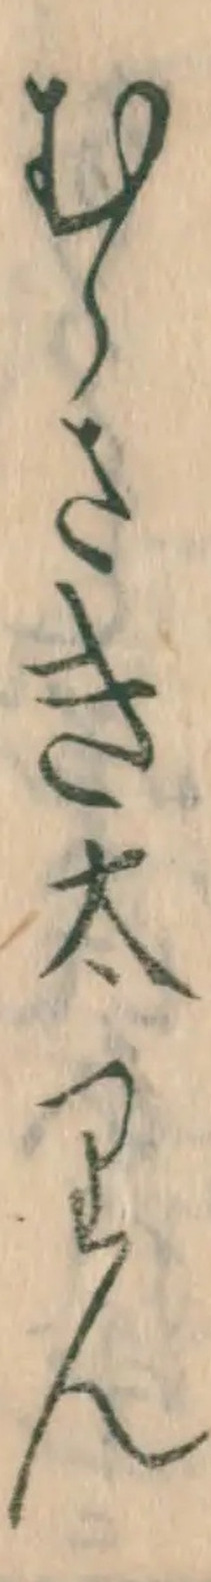むらさき太りん
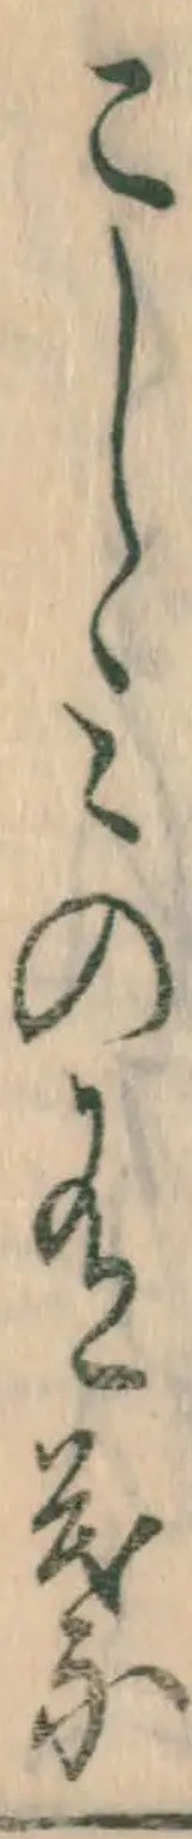こしみの有葉
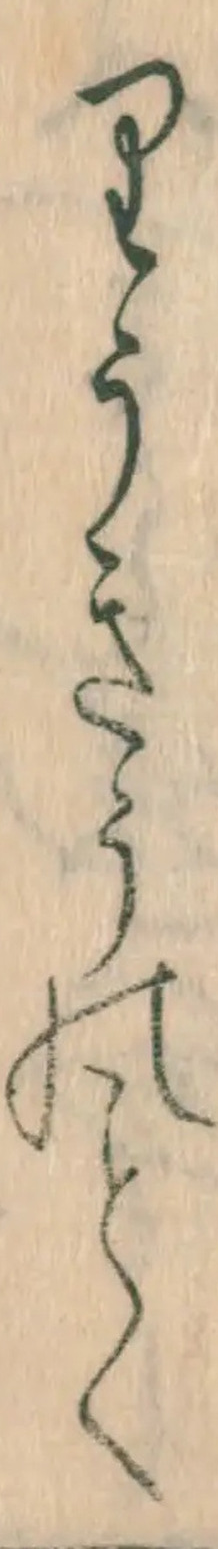りうきうのことく
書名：錦繍枕 5巻. [2]
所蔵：国立国会図書館 National Diet Library, JAPAN
